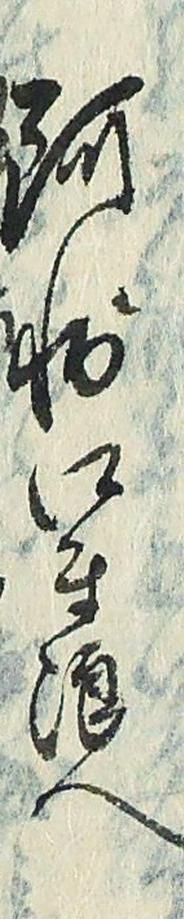一阿州郷付浪人
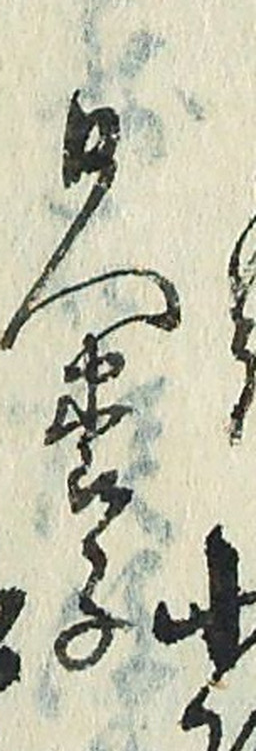同人養子
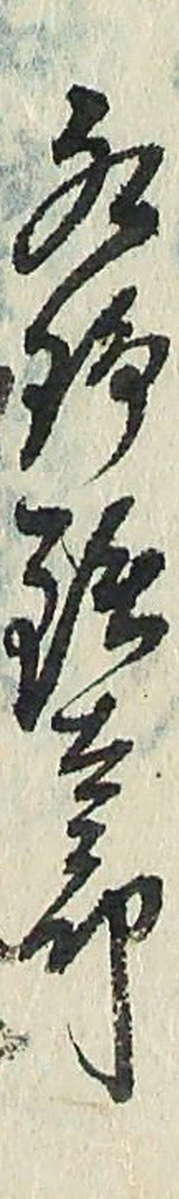水野鉄太郎
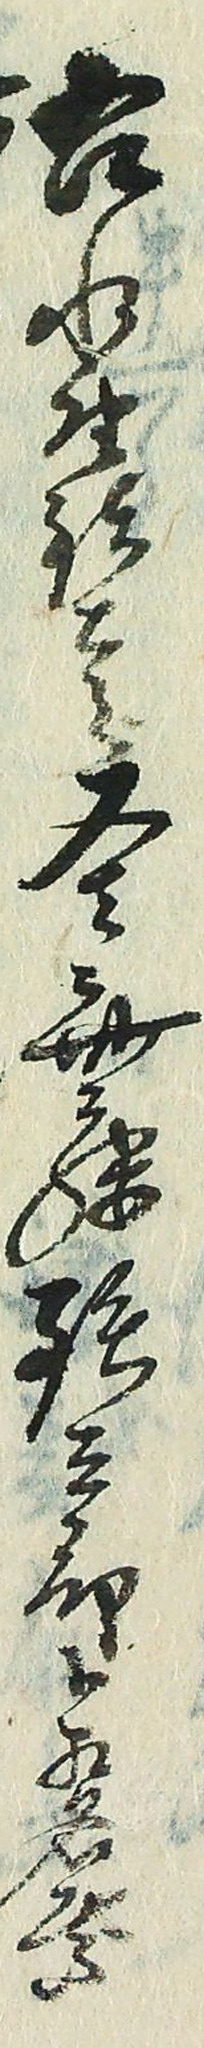右水野鉄太郎又は斎藤鉄太郎と相名乗
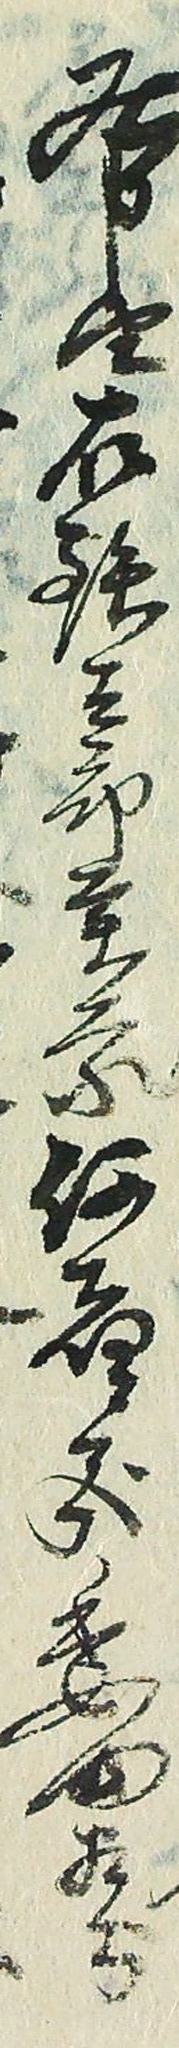居申由右鉄太郎実家何者に候哉委曲相分
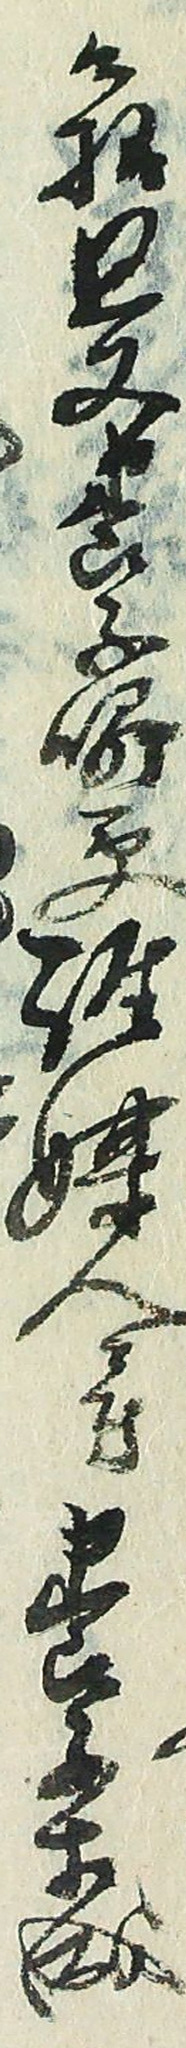候様且又養子囉受誰媒人に付養子相成
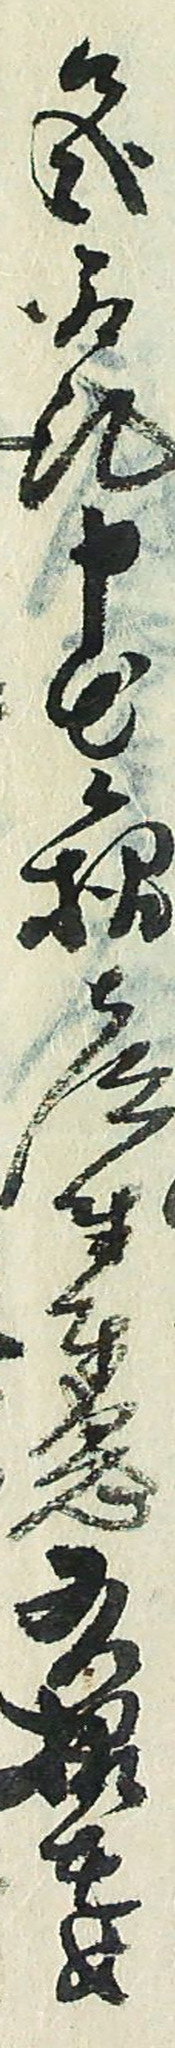候哉取糺申出候様被仰付奉畏右様者義
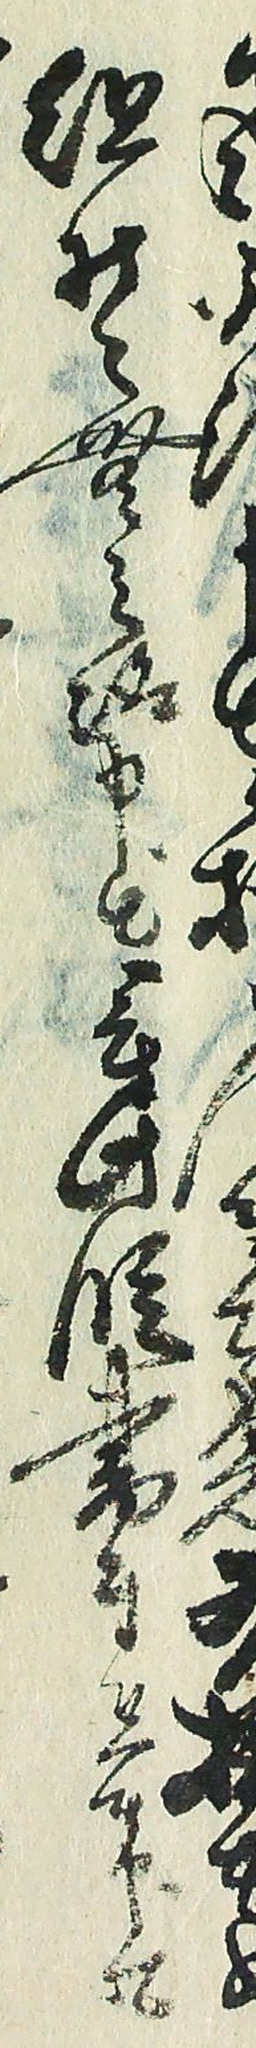組村々無之様申出候付此段書付奉申様
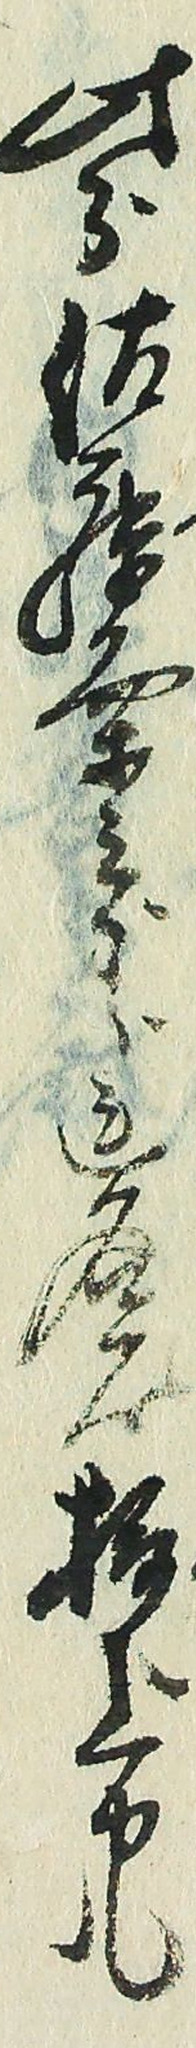此分佐藤粂三郎と連名を以指上申候
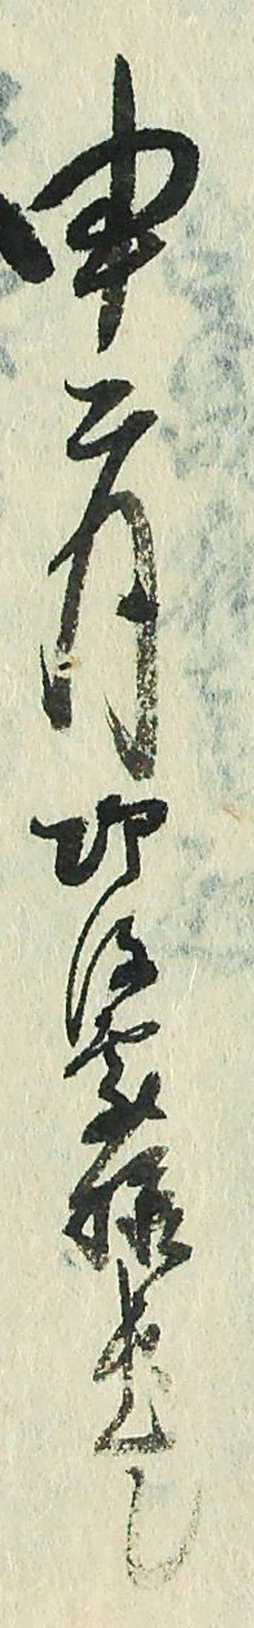申二月御役処様申上候
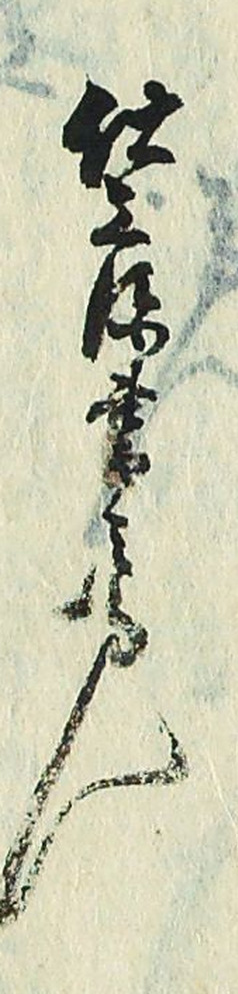仕上添書之覚
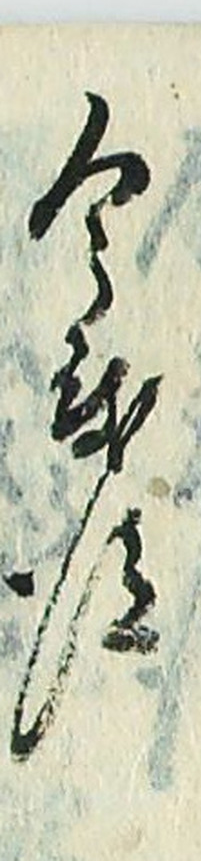今度従
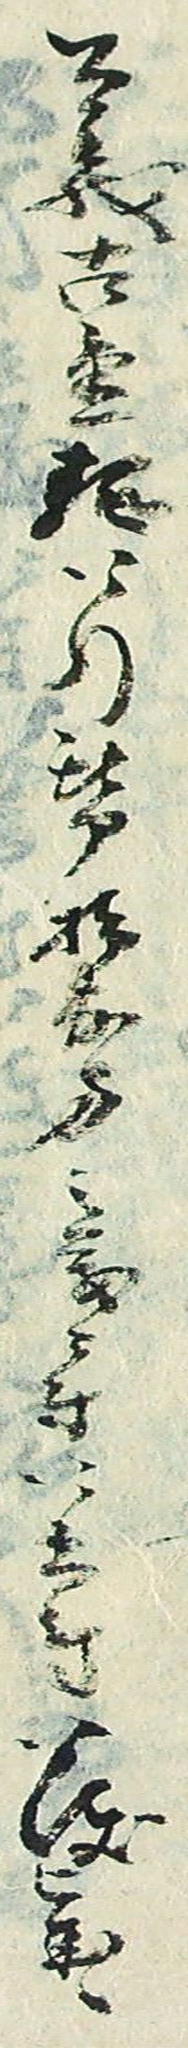公義古金類御引替指成方之義に付御書付御渡被成候

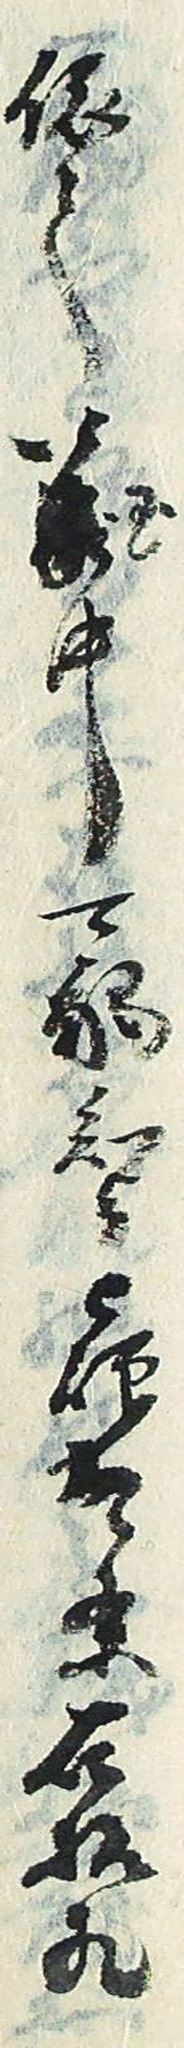依之御国中可触知旨被仰出候条右様相
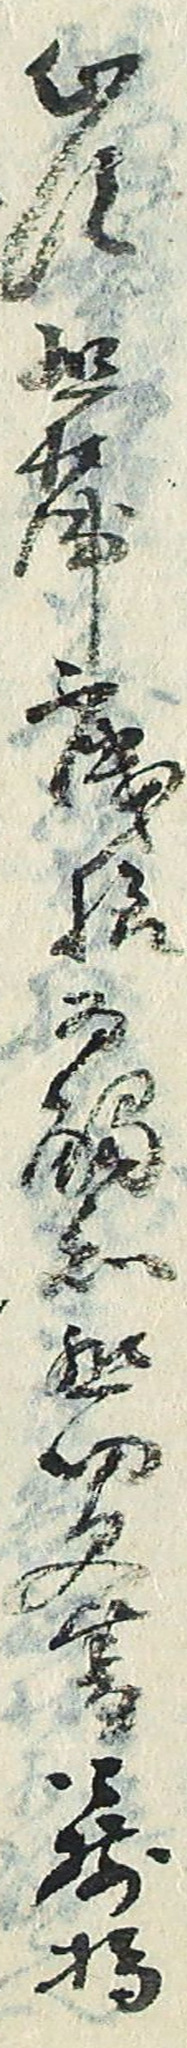心得組村浦不洩様為触知組切受書取揃指
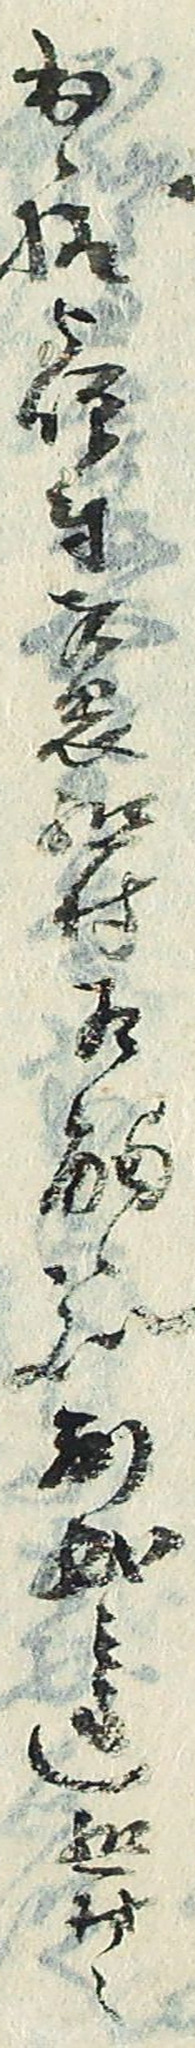出候様被仰付奉畏組村相触候処別紙之通組村々
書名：諸御用御□受書控
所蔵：鳴門教育大学 Naruto University of Education
